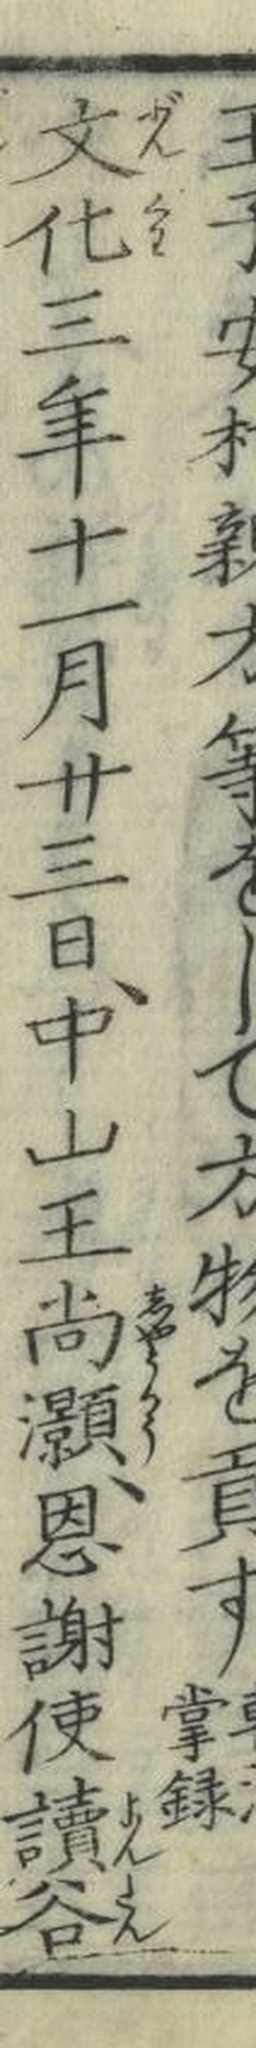文化三年十一月廿三日、中山王尚灝、恩謝使読谷
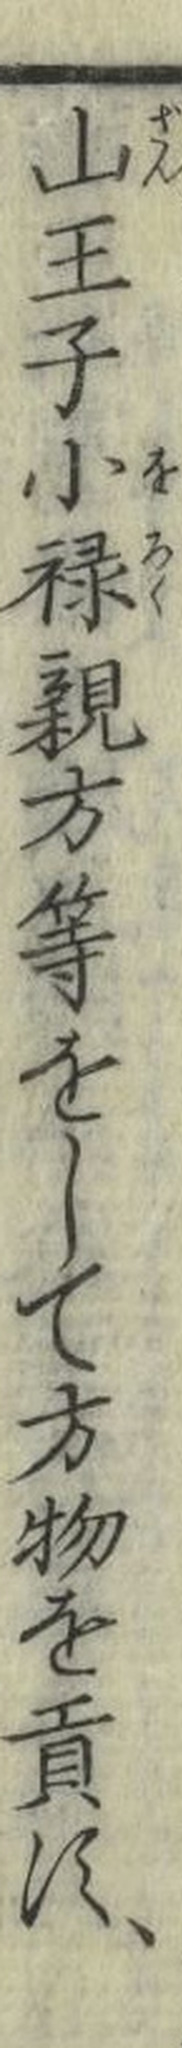山王子小禄親方等をして方物を貢す、

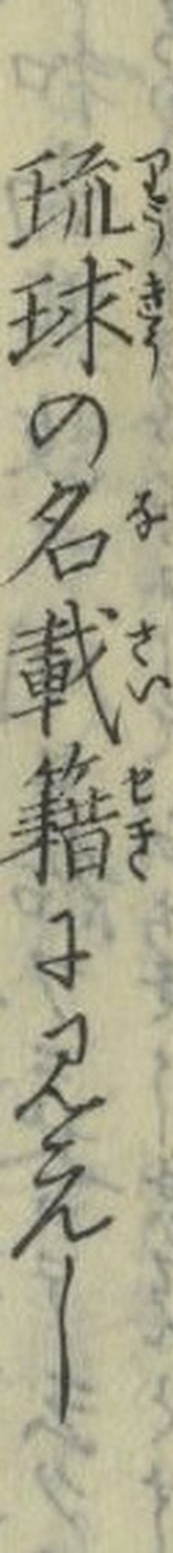琉球の名載籍に見えし
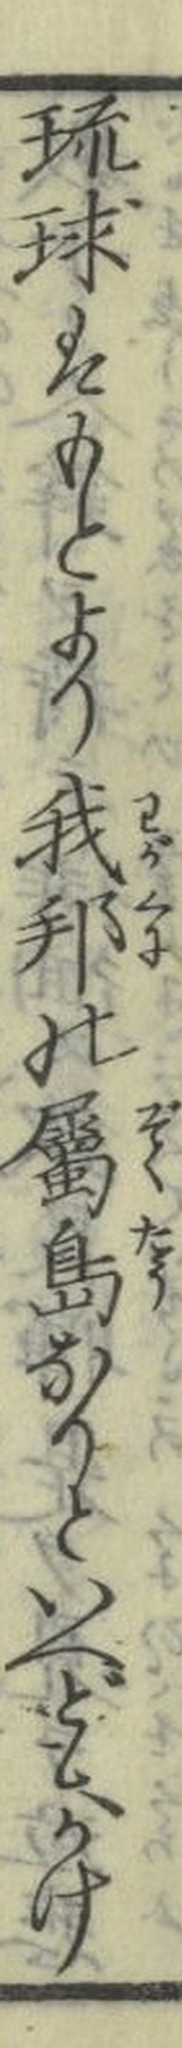琉球はもとより我邦の属島なりといへども、かけ
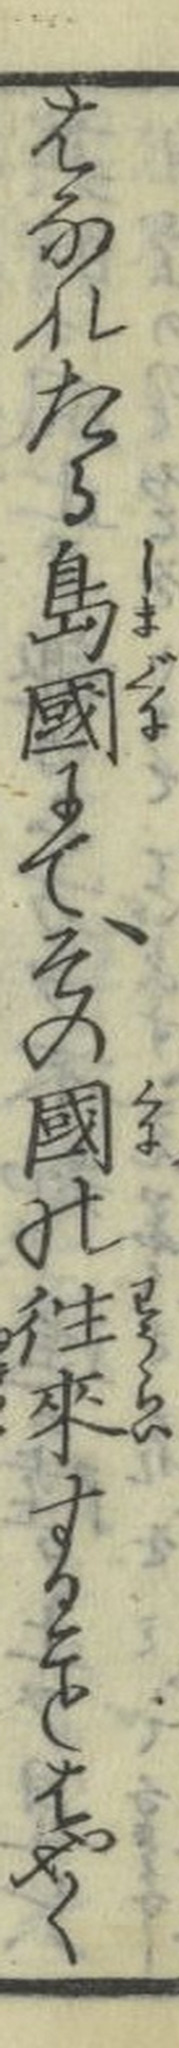はなれたる島国にて、その国の往来することはやく
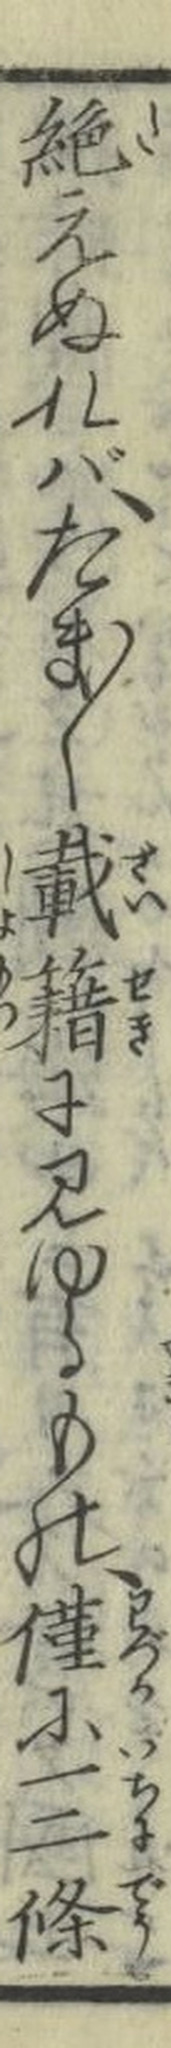絶えぬれば、たま〳〵載籍に見ゆるもの、僅に一二条
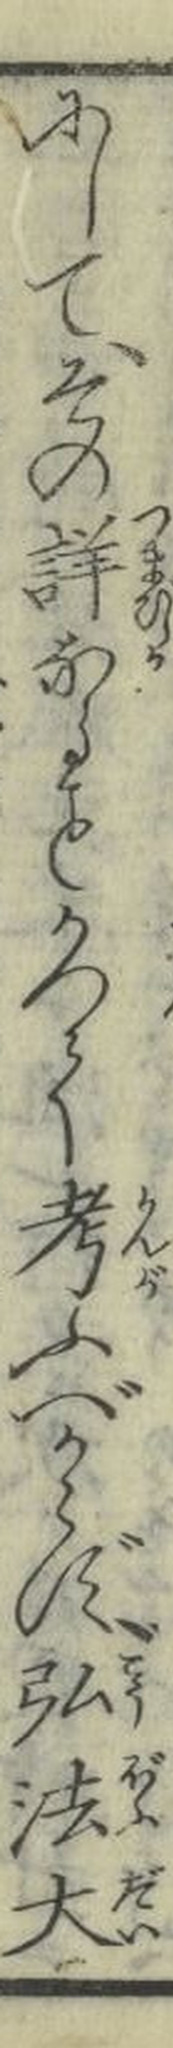にして、その詳なることかつて考ふべからず、弘法大
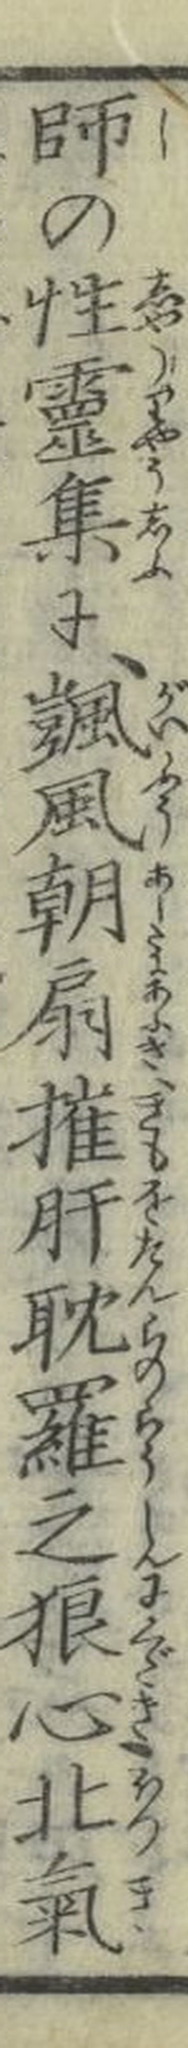師の性霊集に、颽風朝扇、摧肝耽羅之狼心、北気

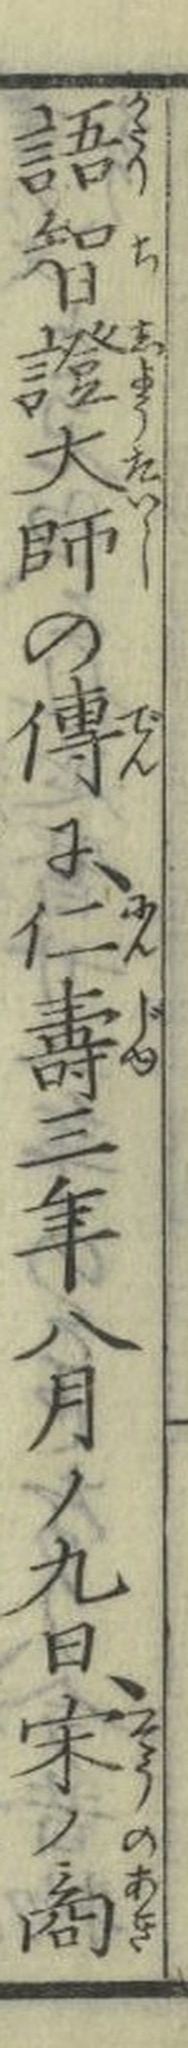語智証大師の伝に、仁寿三年八月ノ九日、宋ノ商
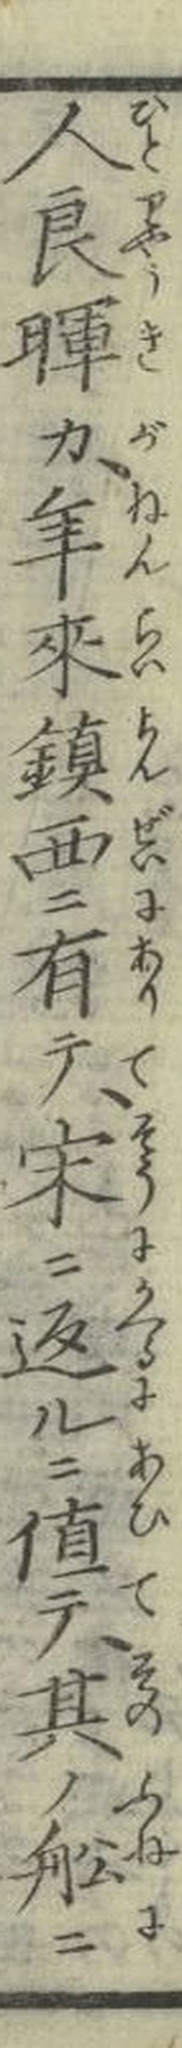人良暉カ、年来鎮西ニ有テ、宋ニ返ルニ値テ、其ノ船ニ
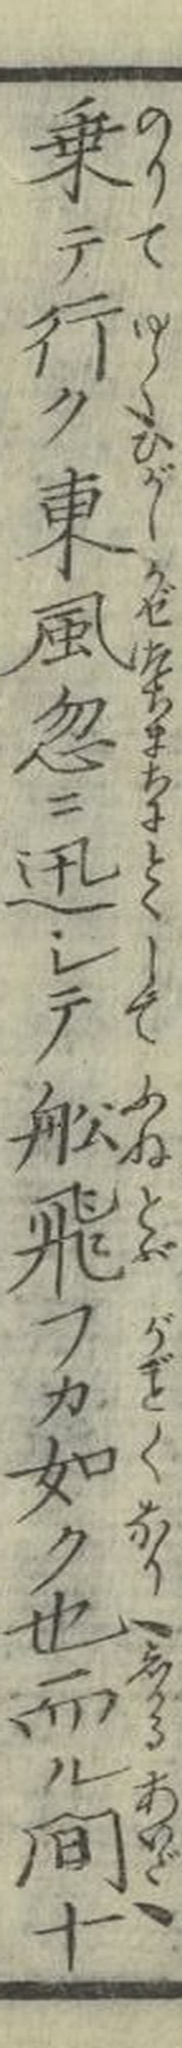乗テ行ク、東風忽ニ迅シテ船飛フカ如ク也、而ル間、十
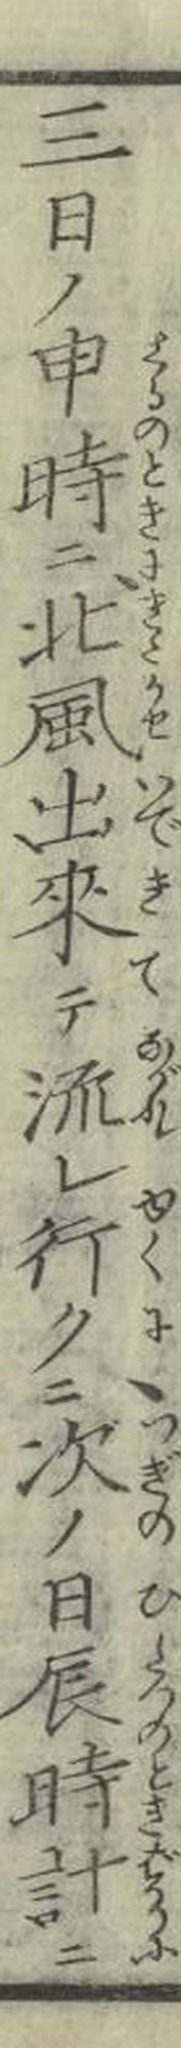三日ノ申時ニ、北風出来テ流レ行クニ、次ノ日辰時計ニ
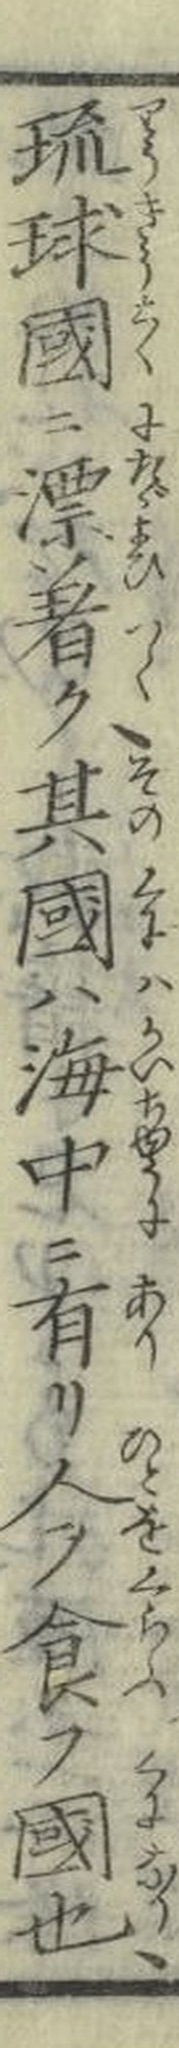琉球国ニ漂着ク、其国ハ海中ニ有リ人ヲ食フ国也、
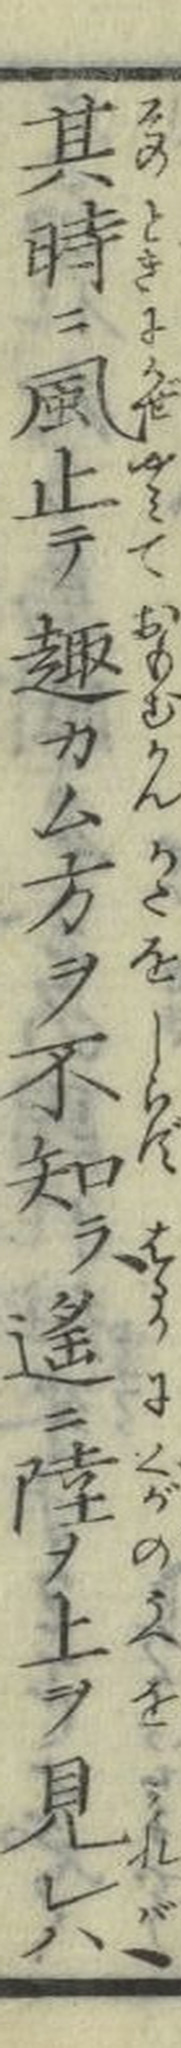其時ニ風止テ趣カム方ヲ不知ラ、遥ニ陸ノ上ヲ見レハ、
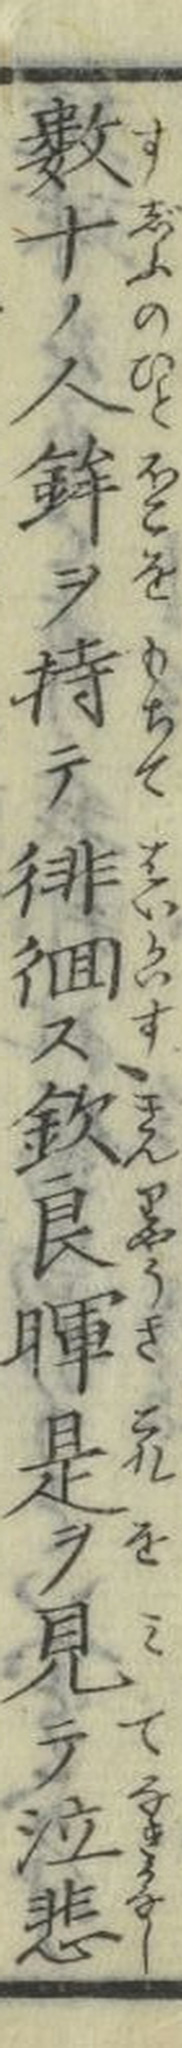数十ノ人鉾ヲ持テ徘徊ス、欽良暉是ヲ見テ泣悲
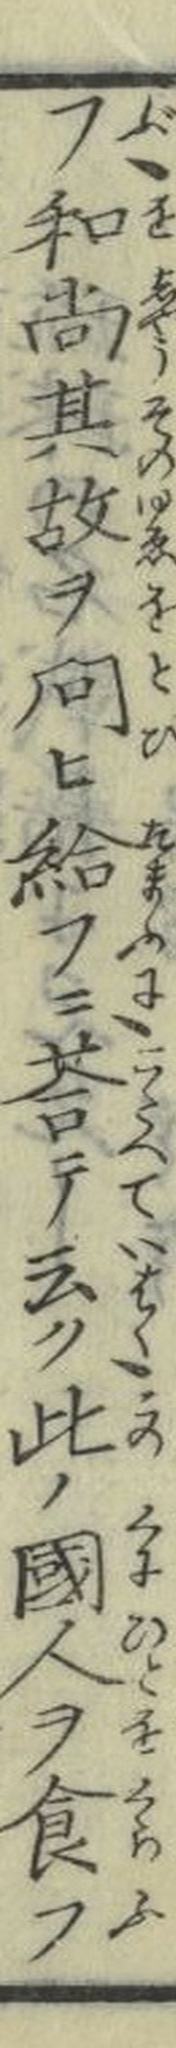フ、和尚其故ヲ問ヒ給フニ、答テ云ク、此ノ国人ヲ食フ
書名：琉球入貢紀畧
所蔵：University of the Ryukyus Library
